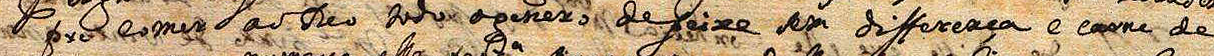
pre comer ao Reo todo o genero de peixe sem differença e carne de
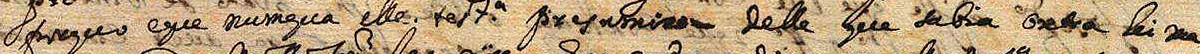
porquo e que numqua elle test.a presumira delle que sabia outra lei ma
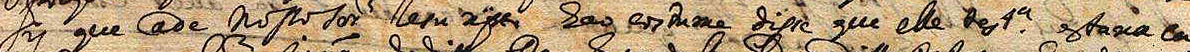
is que a de nosso sor̄ Iesu xpto E ao costume disse que elle test.a estaua ca
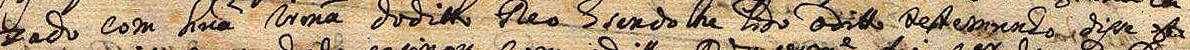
zado com huā Irmā do ditto Reo E sendo lhe lido o ditto testemunho disse esta
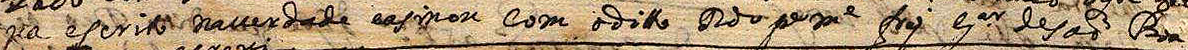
ua escrito na uerdade e asinou com o ditto Rdo pe me frej G.ar de saõ Boa
